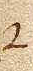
2
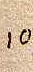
10
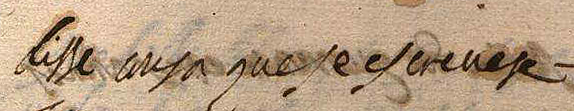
disse cousa que se escreuese
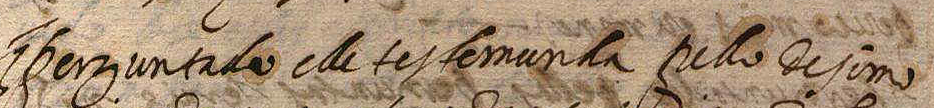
E perguntado elle testemunha pello desimo
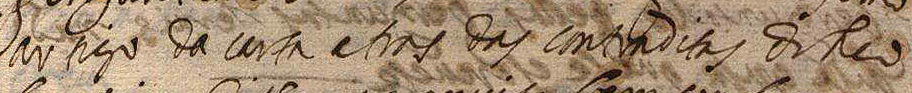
artigo da carta atras das contraditas do Reo
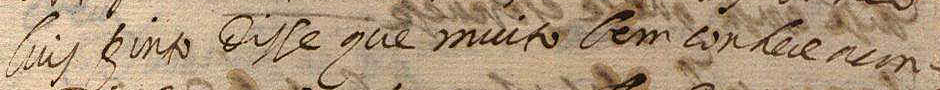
luis pinto disse que muito bem conhece a con
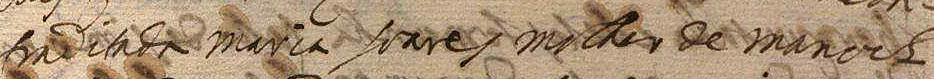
traditada maria soares molher de manoel
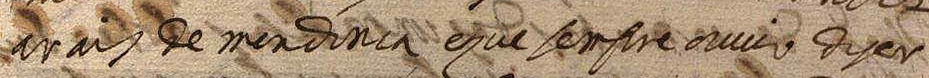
arais de mendonça e que sempre ouuio diser
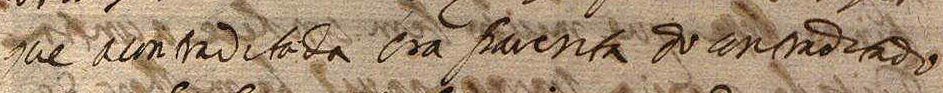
que a contraditada era parenta do contraditado
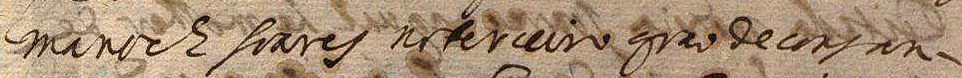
manoel soares no terceiro grao de consan
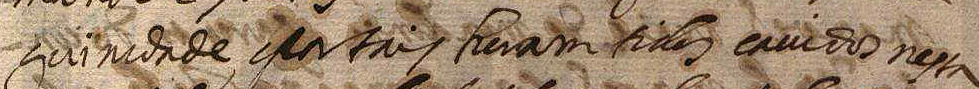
guinidade e por tais heram tidos e auidos nesta
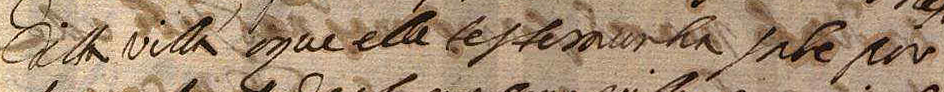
ditta villa o que elle testemunha sabe por
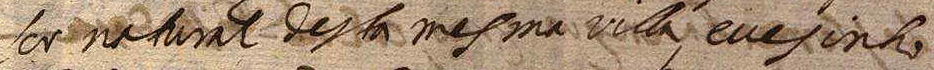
ser natural desta mesma villa e uesinho
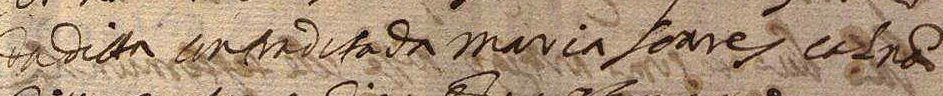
da ditta contraditada maria soares e al não
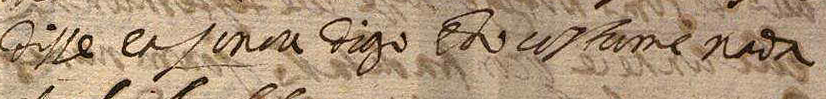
disse e asinou digo e do costume nada
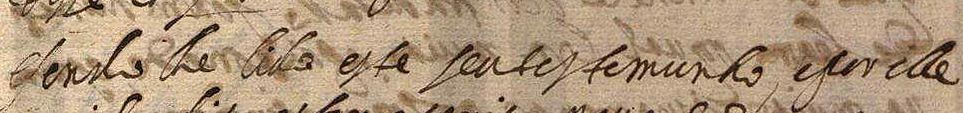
e sendo lhe lido este seu testemunho, e por elle
